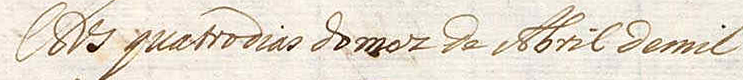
Aos quatro dias do mez de Abril de mil
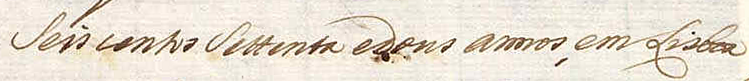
Seiscentos Settenta e dous annos, em Lisboa
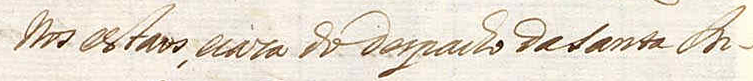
nos estaos, e caza do despacho da Santa In
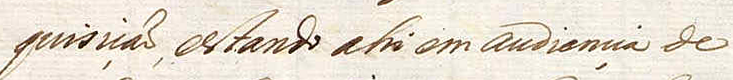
quisição, estando ahi em audiencia de
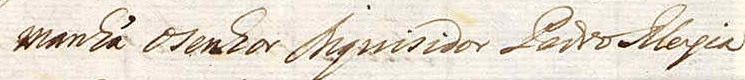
manhã o senhor Inquisidor Pedro Mexia
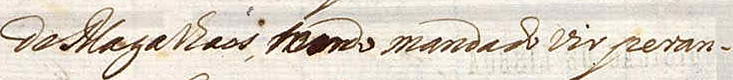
de Magalhaes, tendo mandado vir peran
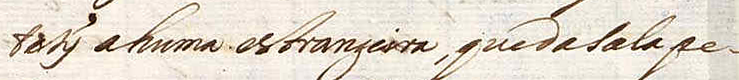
te Sy a huma estrangeira, que da Sala pe
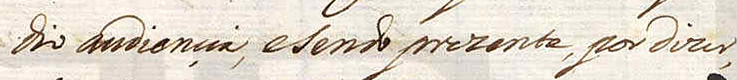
dio audiencia e sendo prezente, por dizer,
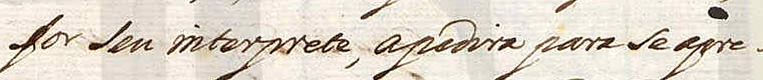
por seu interprete, a pedira para se apre
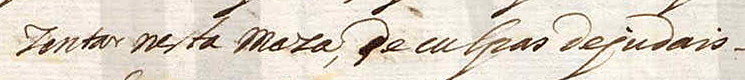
zentar nesta meza de culpas de judais
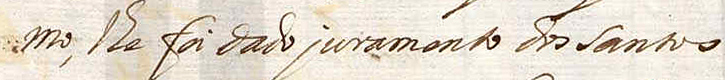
mo, lhe foi dado juramento dos Santos
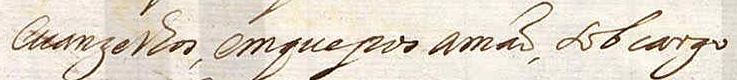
Euangelhos, em que pos a mão, sob cargo
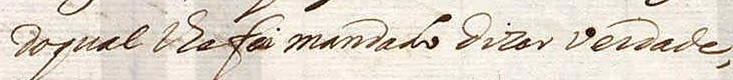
do qual lhe foi mandado dizer verdade,
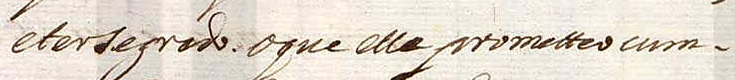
e ter segredo. O que ela prometteo cum
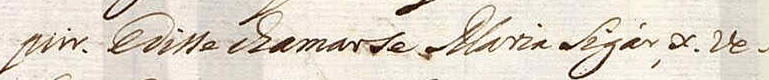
prir. E disse chamar se Maria Sigár, x. ve
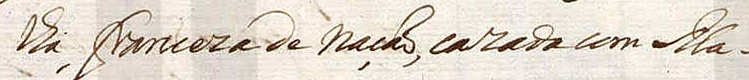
lha, franceza de nação, cazada com Ma
